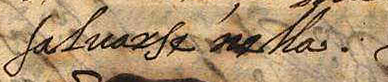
saLuarse nella.
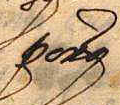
porq̄
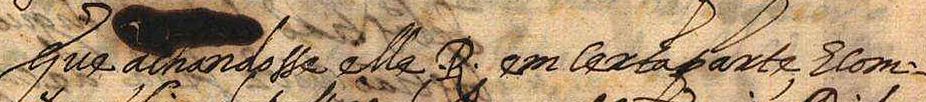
Que achandosse elle .R. em certa parte, E com
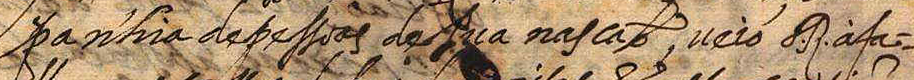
panhia de pessoas de sua nascaõ, ueio o .R. a fa
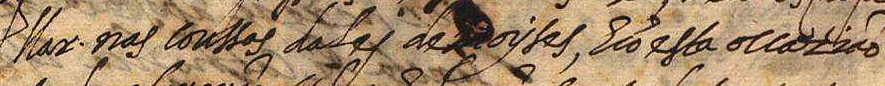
llar. nas coussas da Lej de moyses, E cō esta occaziaõ
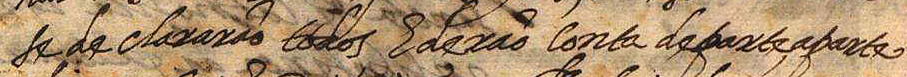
se declararão todos E deraõ conta de parte, a parte
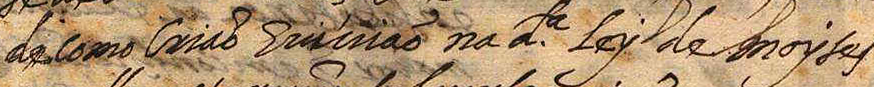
de como criaõ E uiuiaõ na d̄.a Ley de moyses
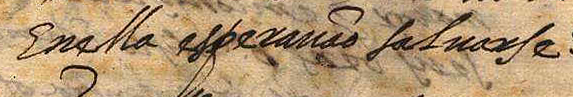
E nella esperauão saLuarse.
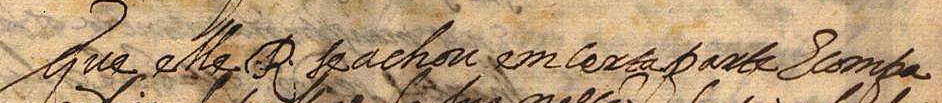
Que elle .R. se achou em certa parte E compa
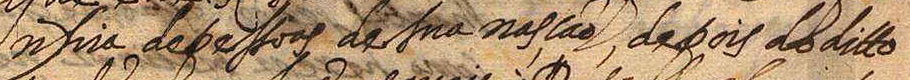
nhia de pessoas de sua nasçaõ, depois do ditto
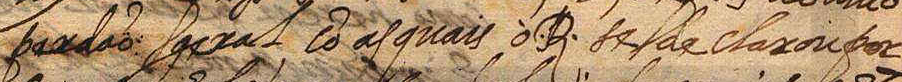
perdaõ geral, cō as quais o .R. se declarou por
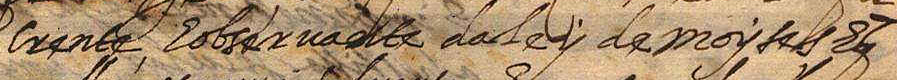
crente, e obseruante da Ley de moyses E q̄
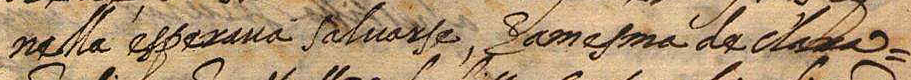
nella esperaua saluarse, E a mesma declara
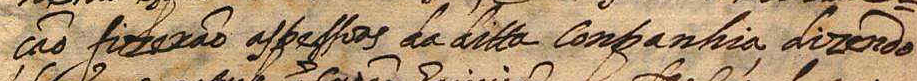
ção fizerão as pessoas da ditta conpanhia, dizendo
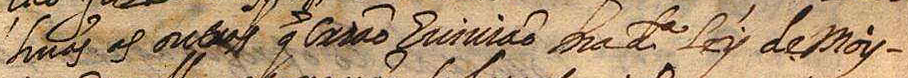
huās as outras q̄ crião E uiuiaõ na d̄a Ley de moy
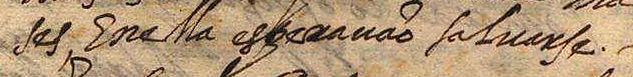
ses, E nella esperauaõ saluarse.
